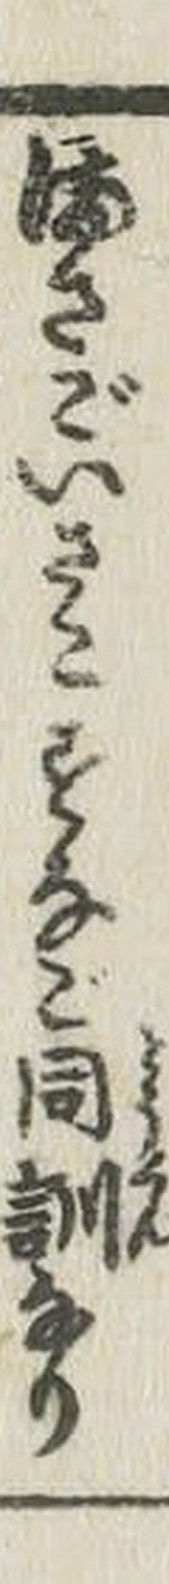まさごいさこすなご同訓なり
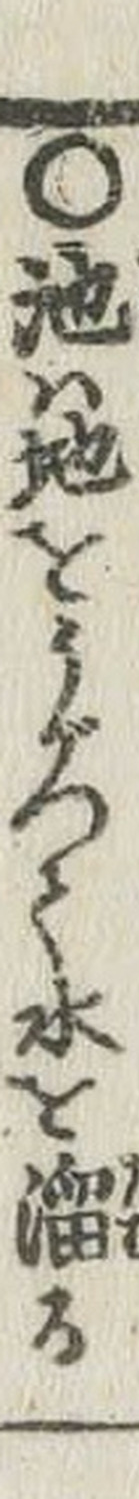○池は地をうがつて水を溜る
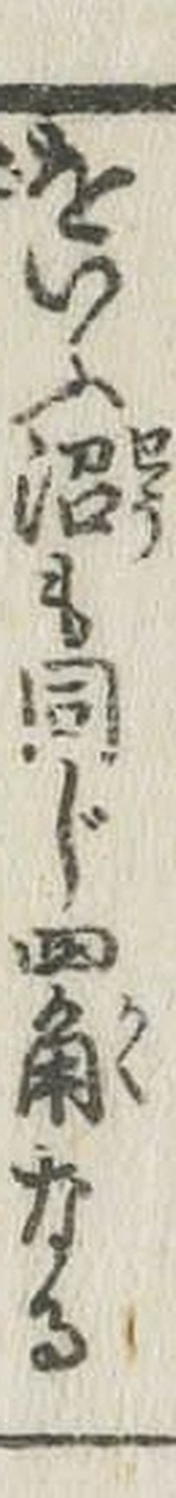をいふ沼も同じ四角なる
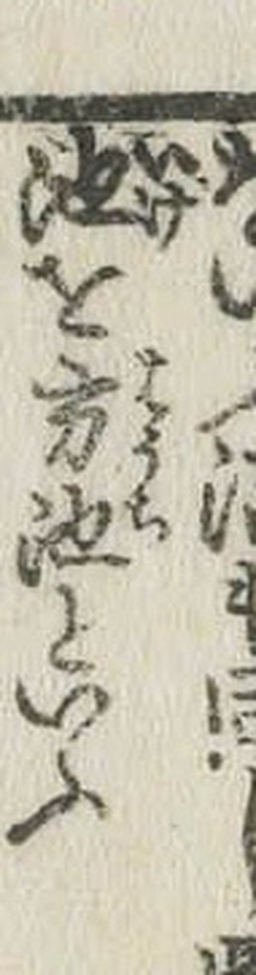池を方池といふ
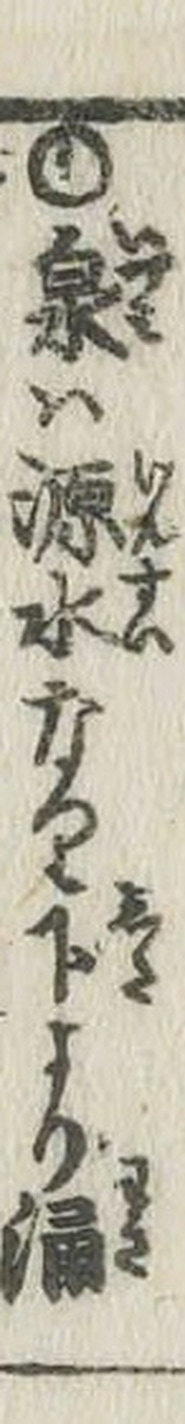○泉は源水なり下より涌
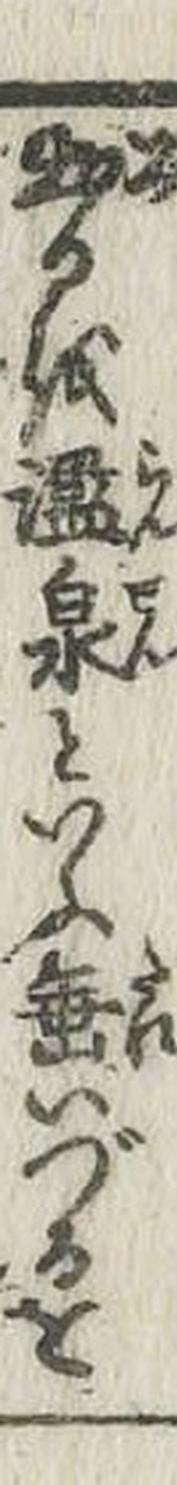出るを濫泉といふ垂いづるを
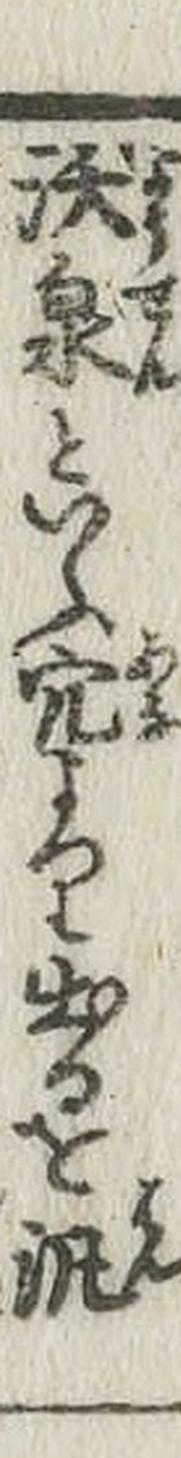沃泉といふ穴より出るを汎
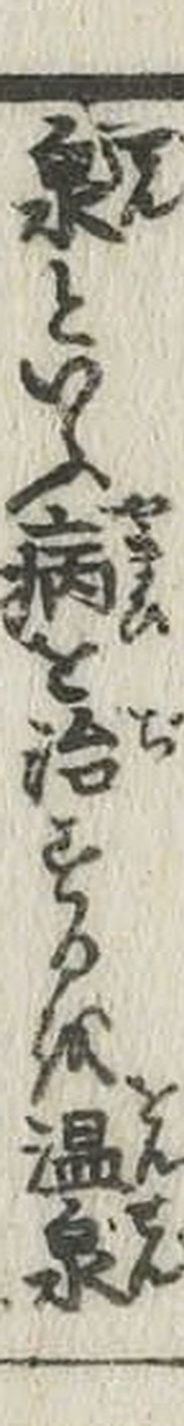泉といふ病を治するを温泉
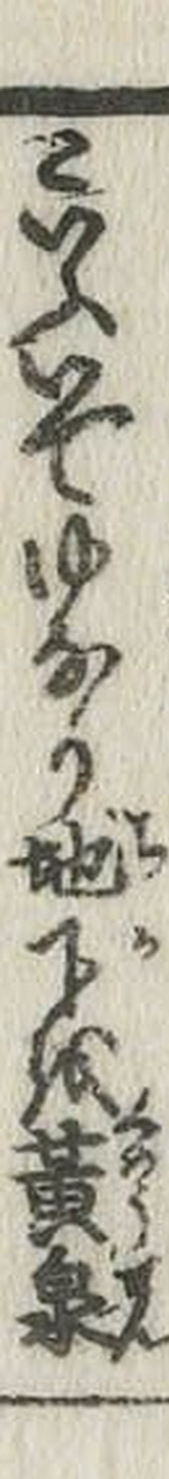といふいでゆなり地下を黄泉
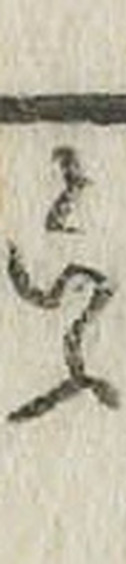といふ
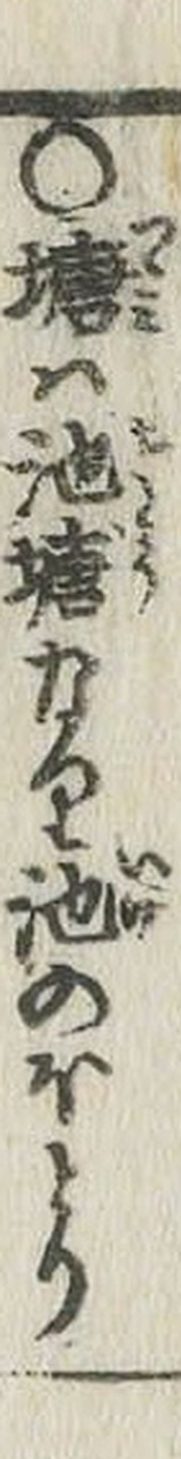○塘は池塘なり池のほとり
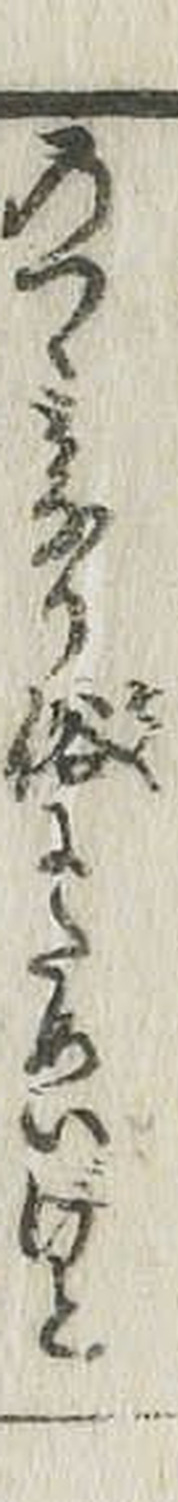のつゝみなり俗にためいけと
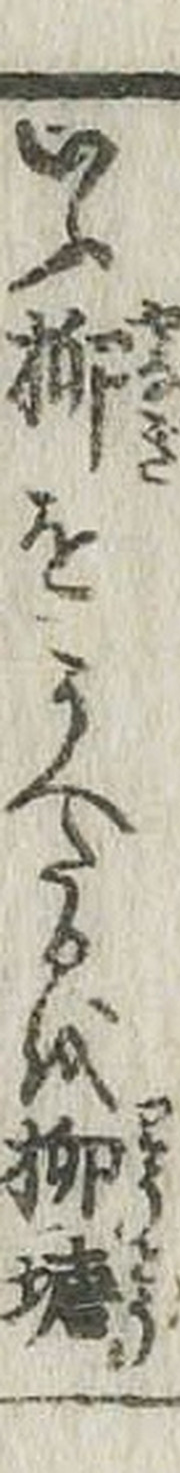いふ柳をうへたるを柳塘
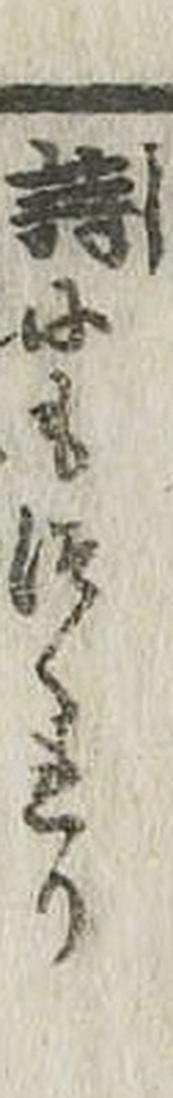詩にもつくれり
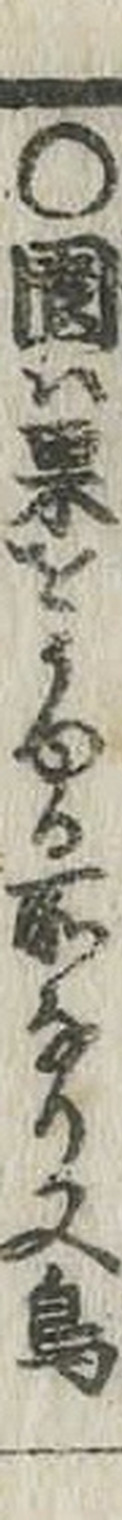○園は果をうゆる所なり又鳥

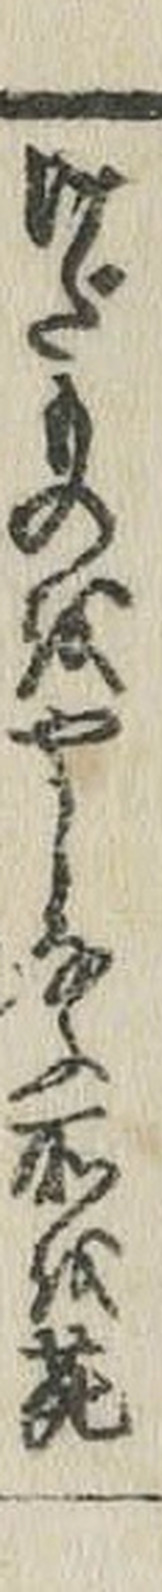けだものをやしなふ所を苑
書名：増補頭書訓蒙図彙大成 10巻 2:巻之1-3
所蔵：東京学芸大学教育コンテンツアーカイブ
